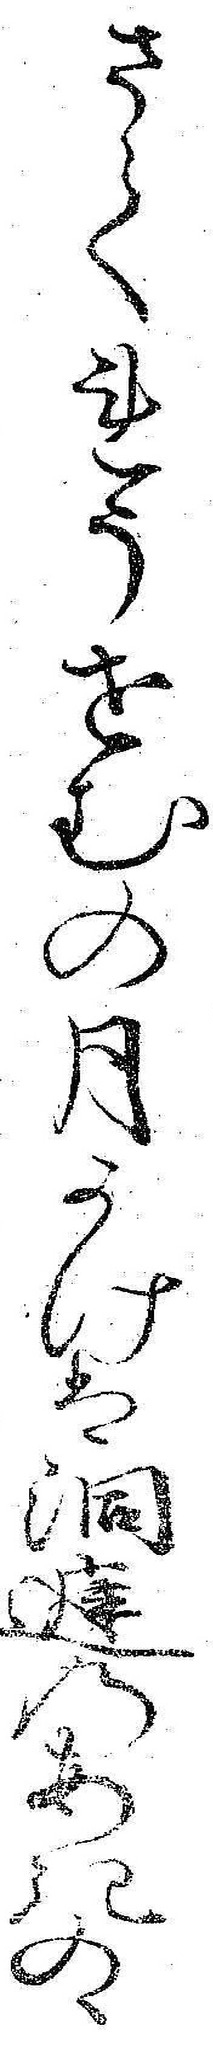さてれうせむの月かけは洞庭のあきのゝ
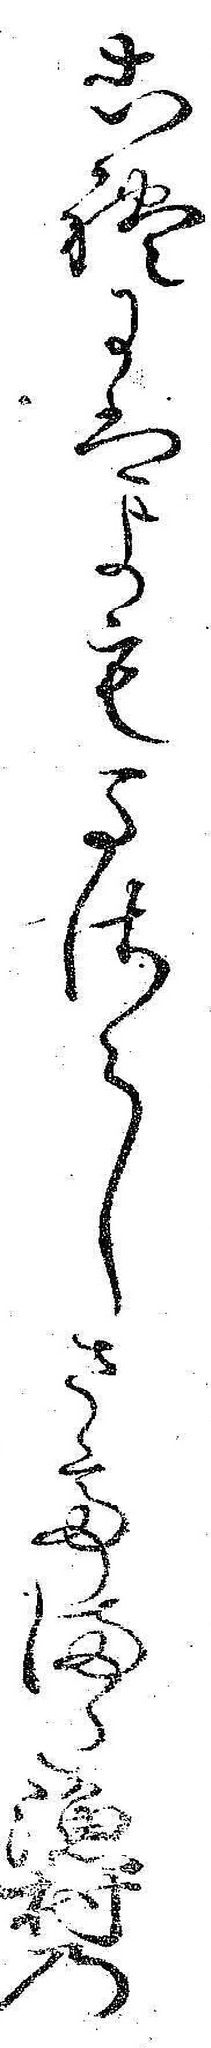これにはよもまさらしさてまた漁村の
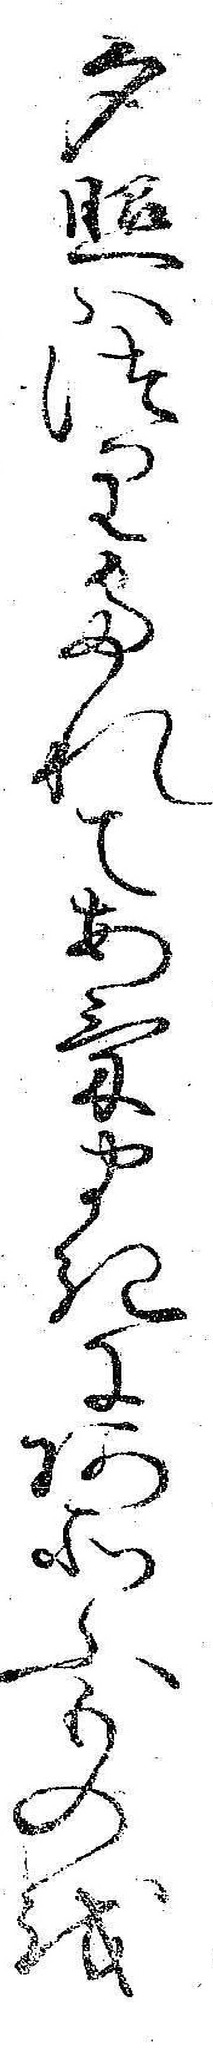夕照はつりたれてあけまきにあそふものを
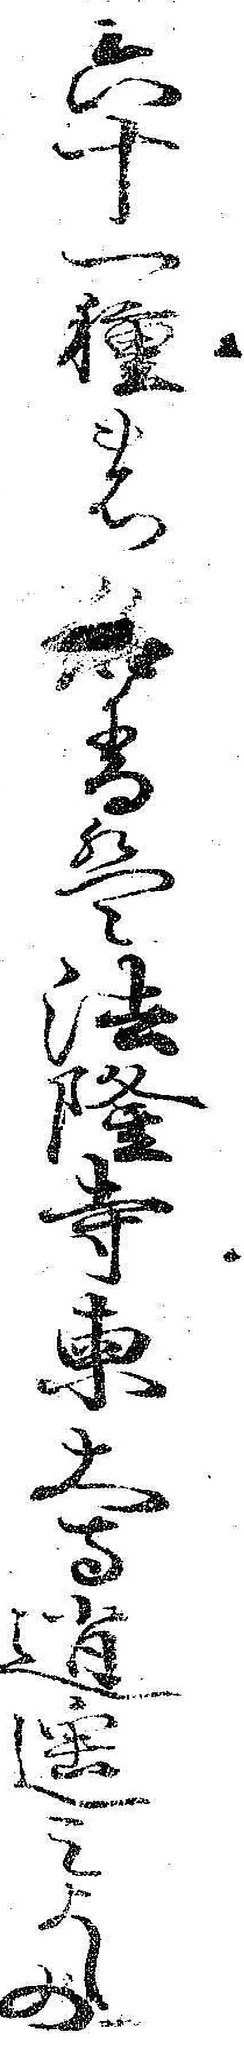六十一種の名香は法降寺東大寺逍遥みよしの
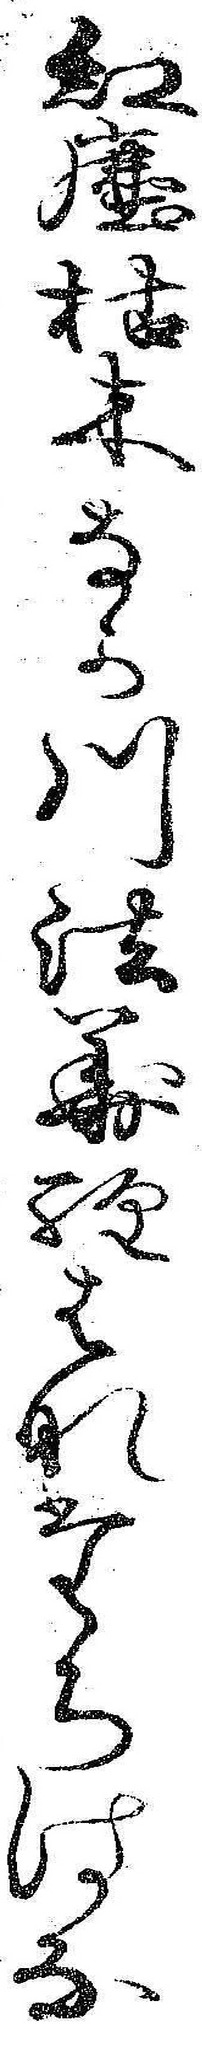紅塵枯木なか川法華経はなたちはな
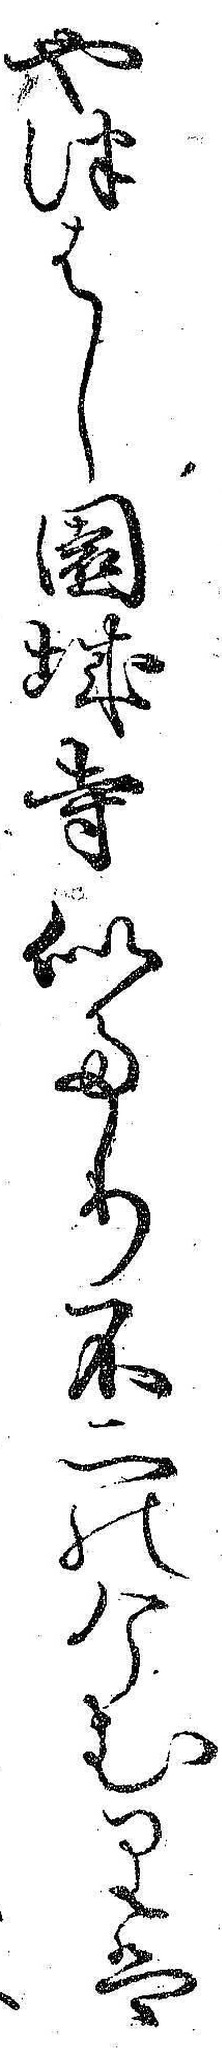やつはし園城寺似たり不二のけむりは
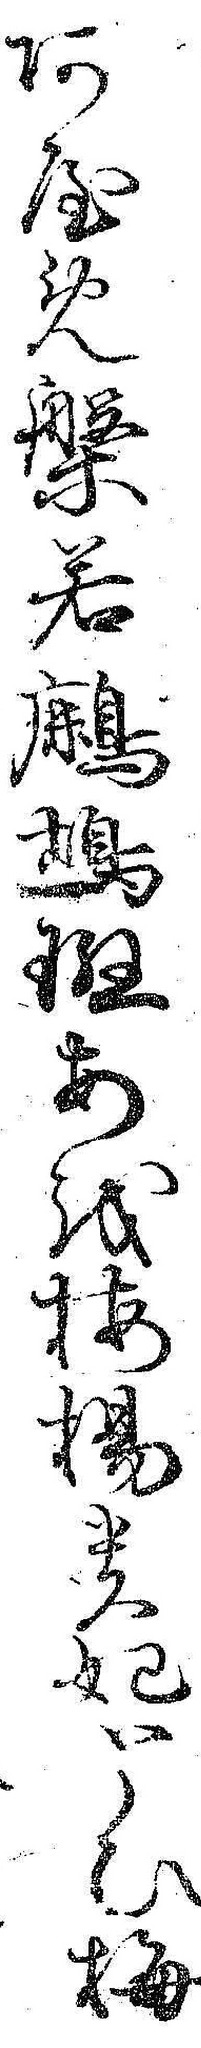あやめ槃若鷓鴣あを梅楊貴妃とひ梅
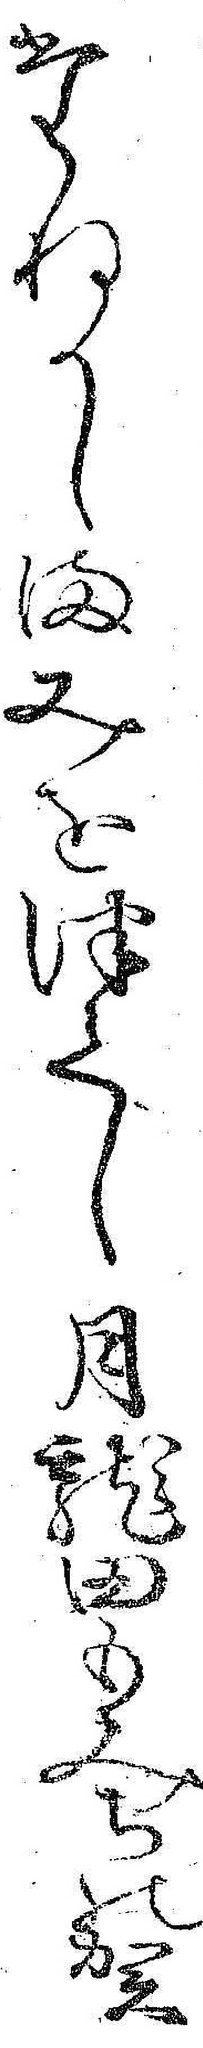たねかしまみをつくし月竜田もみちの賀
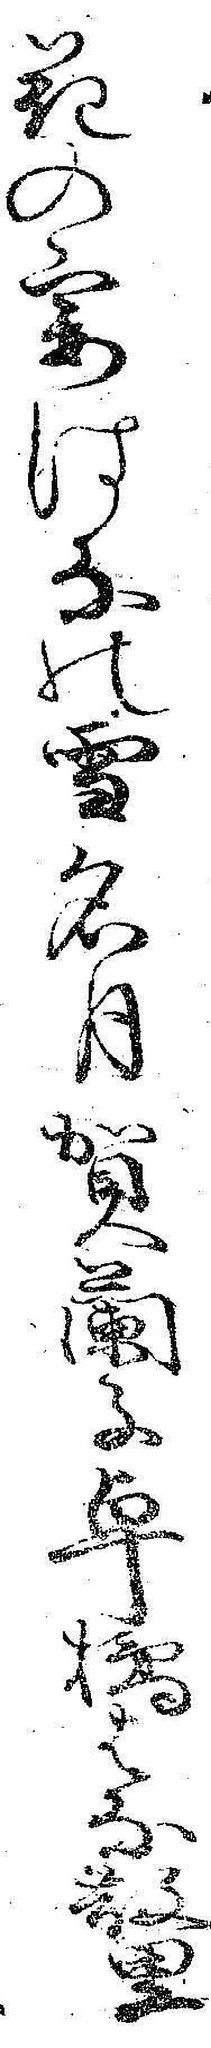花の宴はなの雪名月賀蘭子卓橘はな散里
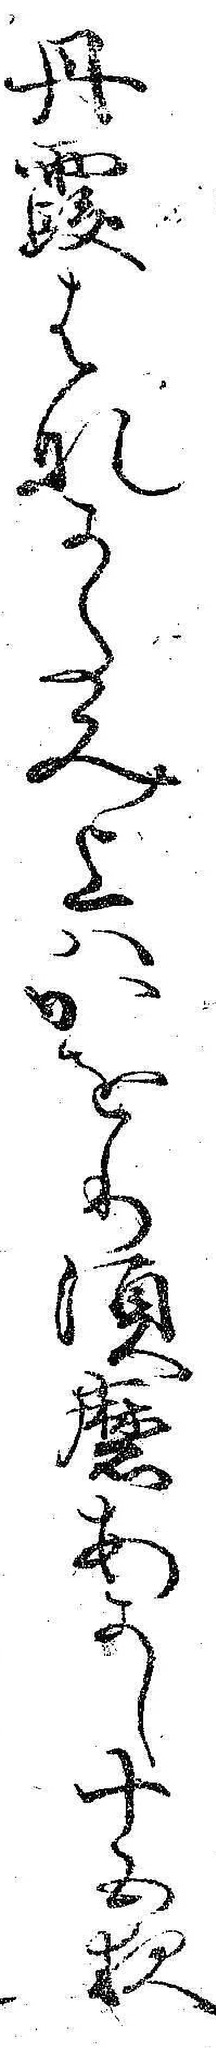丹霞はなかたみ上はかをり須磨あかし十五夜
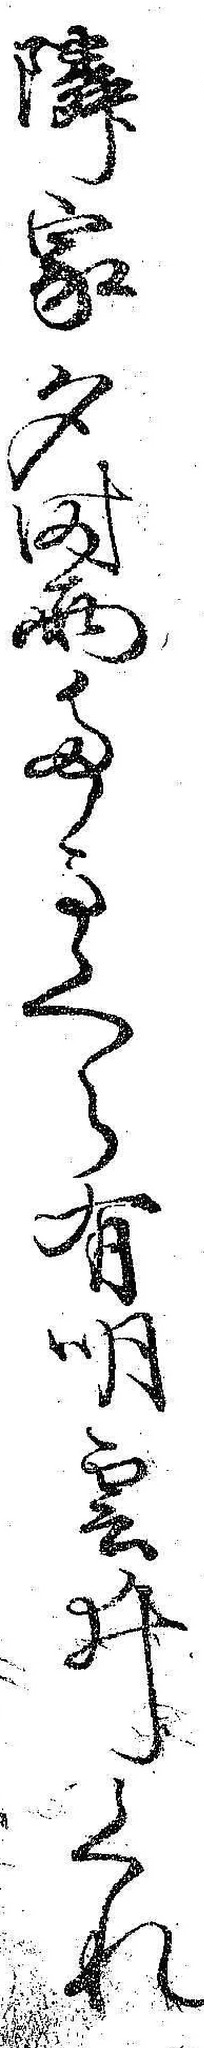隣家夕時雨たまくら有明雲井くれ

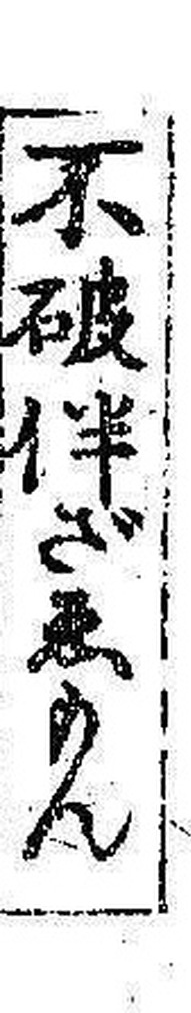不破伴ざゑもん
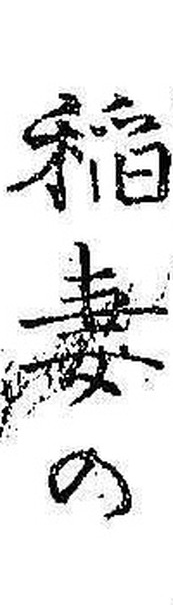稲妻の
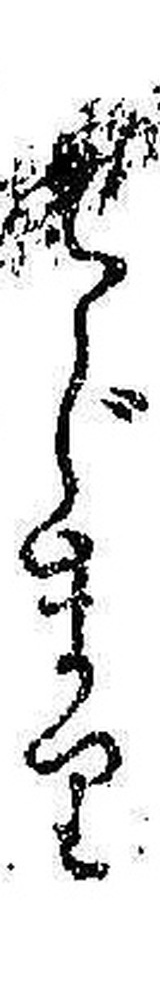はじまり
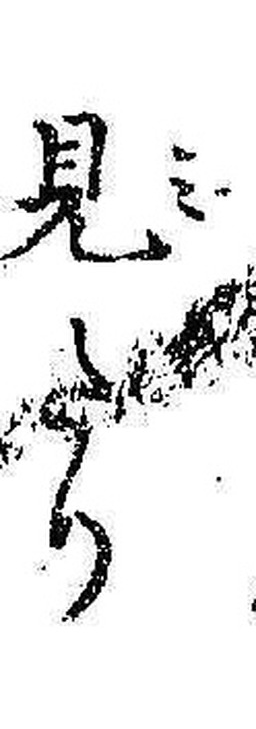見たり
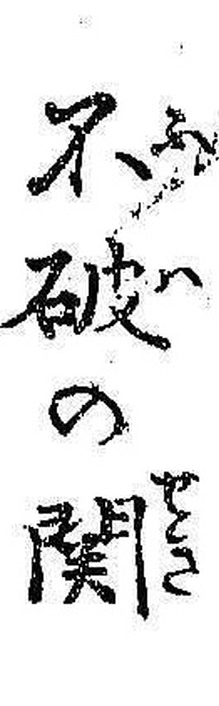不破の関
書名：昔話稲妻表紙
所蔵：国文学研究資料館
